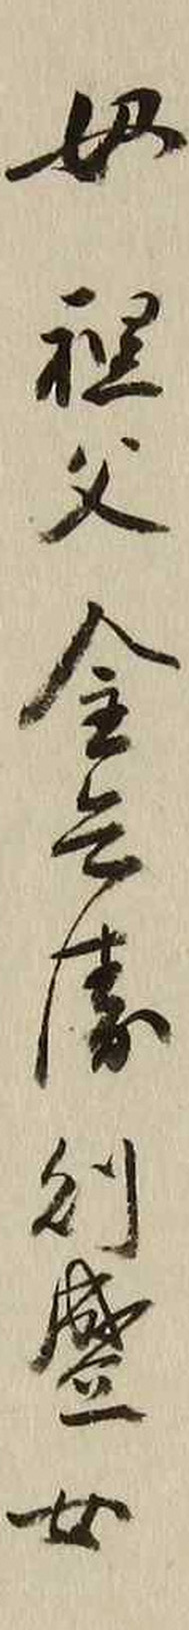母祖父金兵衛則盛女
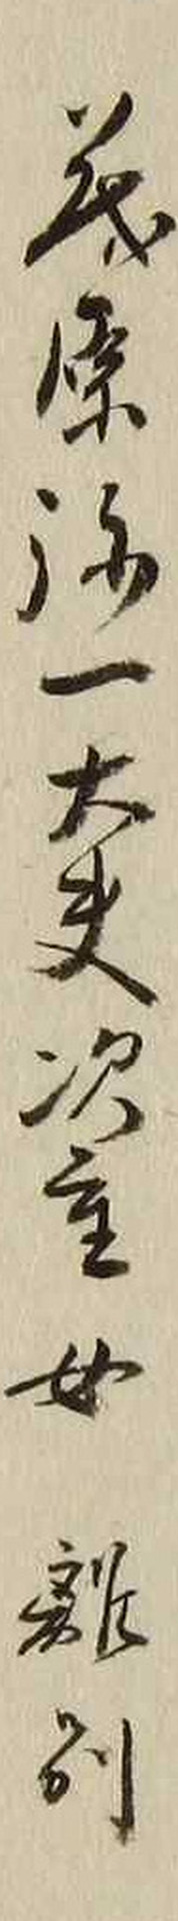茂原弥一大夫次重女影離別
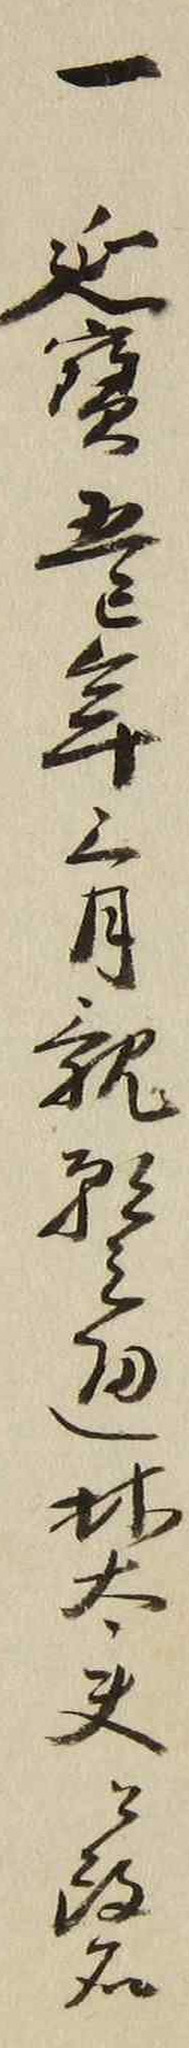一延宝五巳年三月親願之通林太夫と改名
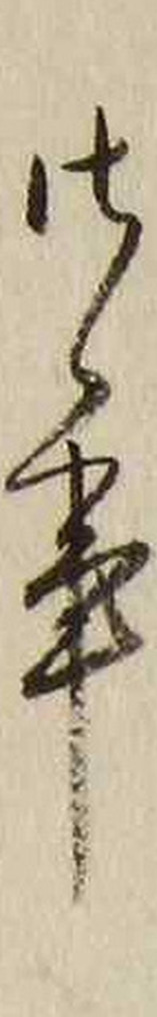仕候事
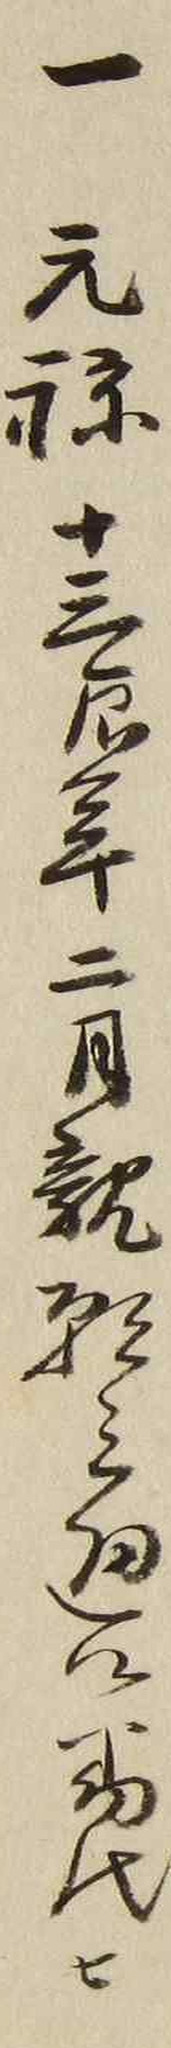一元禄十三辰年二月親願之通御番代被
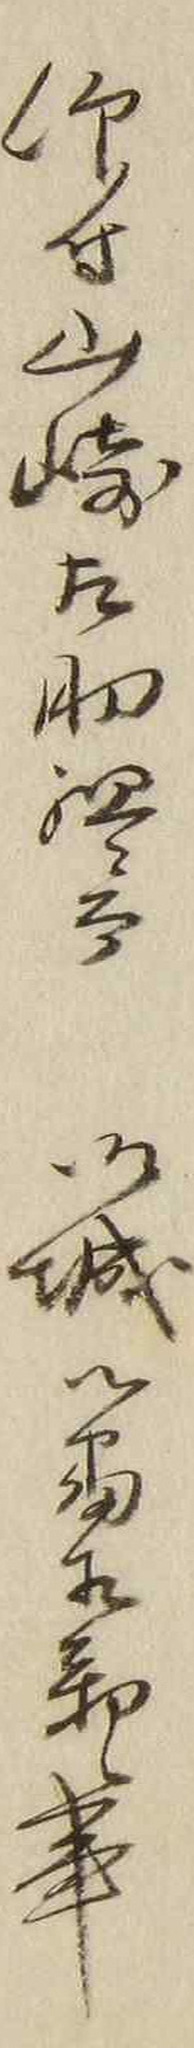仰付山崎左助組ニ而御城御番相勤候事

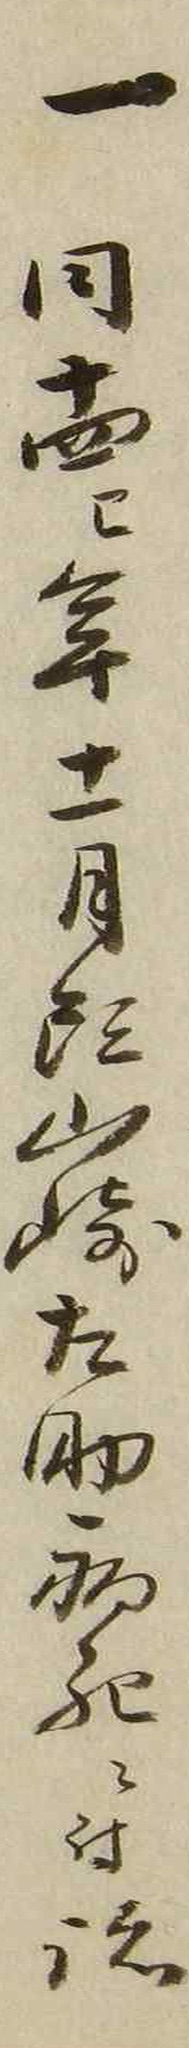一同十四巳年十一月頭山崎左助病死ニ付跡
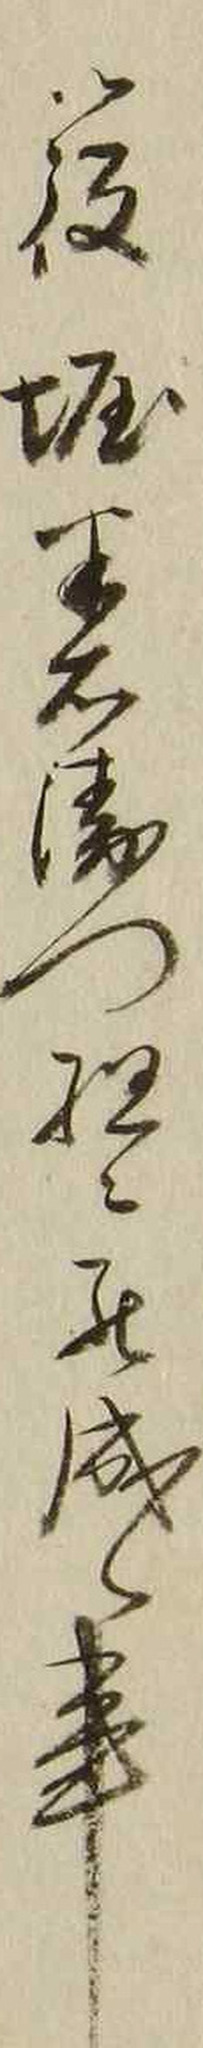御役堀半右衛門組ニ罷成候事
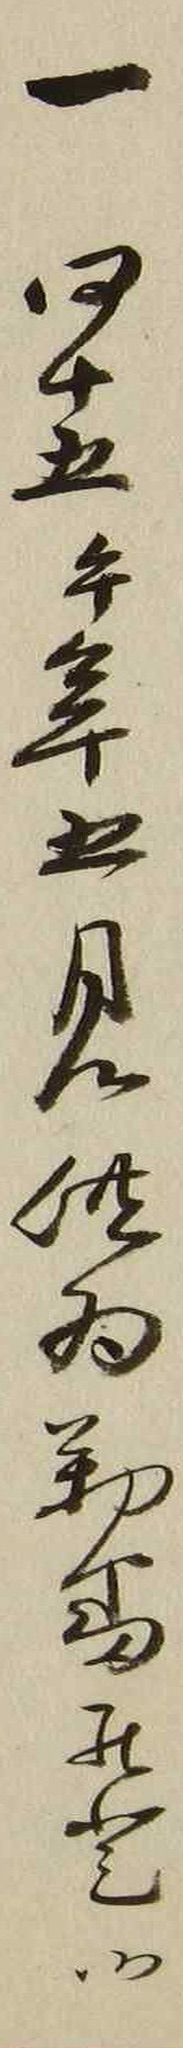一同十五午年五月御供為勤番罷登御
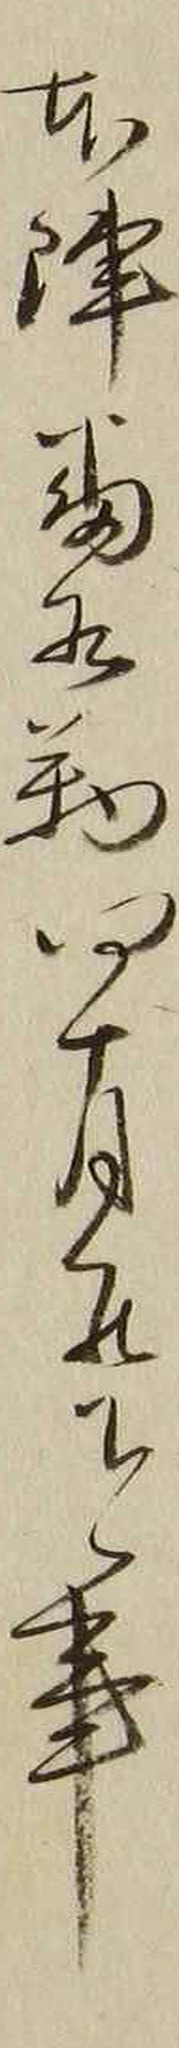本陣番相勤同十月罷下候事
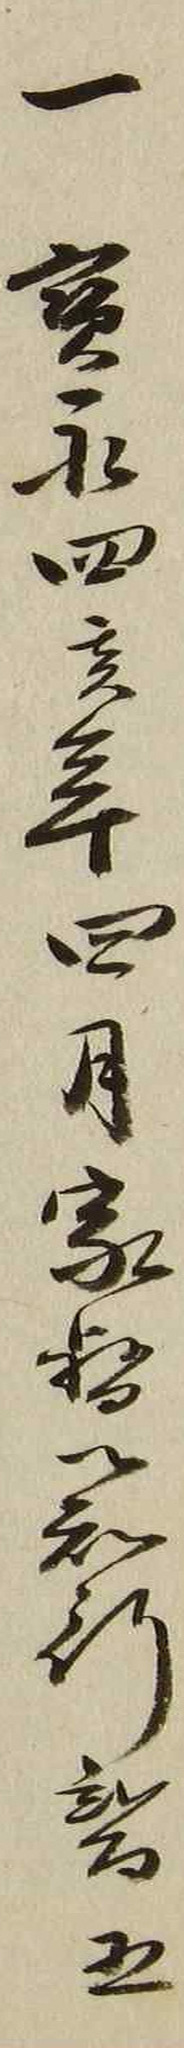一宝永四亥年四月家督御知行弐百五
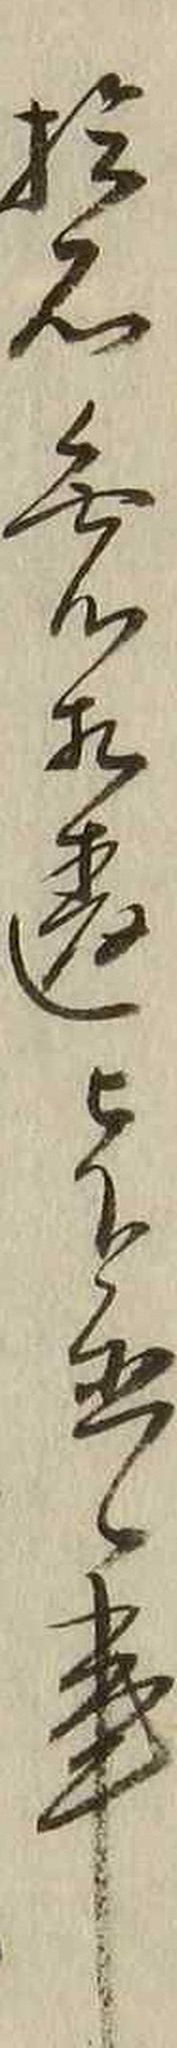拾石無御相違被下置候事
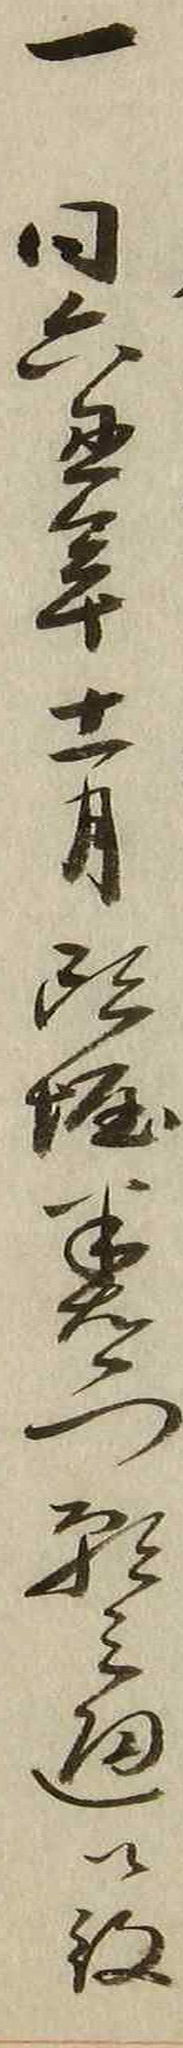一同六丑年十一月頭堀半右衛門願之通御役
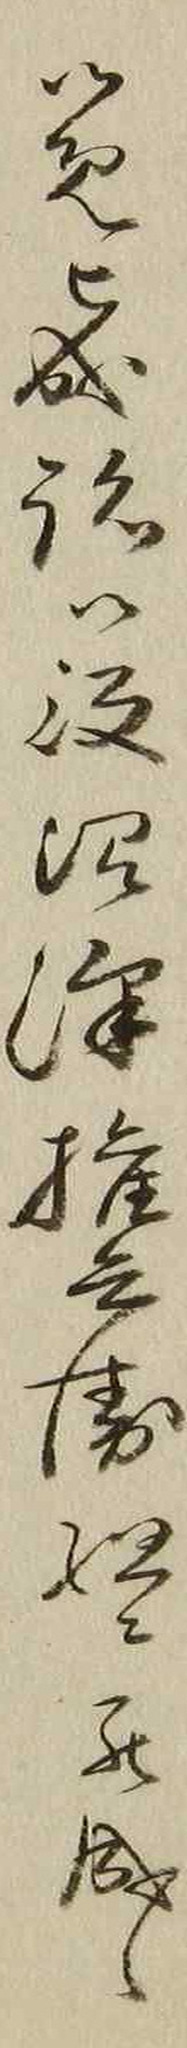御免被成跡御役沼沢津権兵衛組ニ罷成候
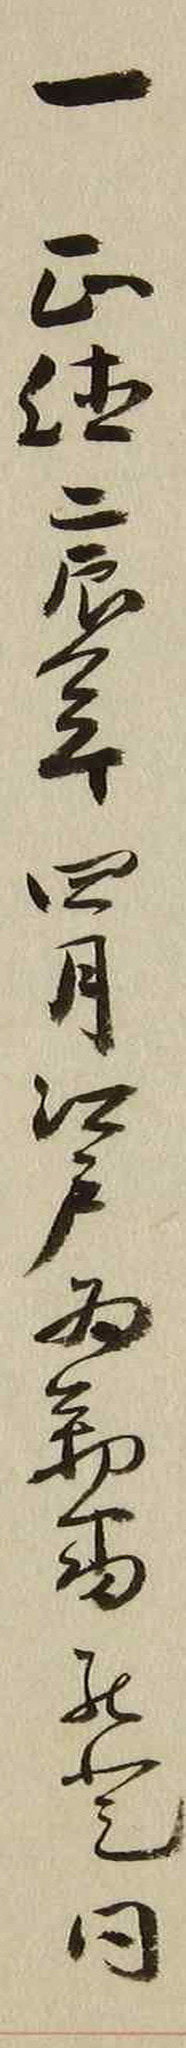一正徳二辰年四月江戸為勤番罷登同
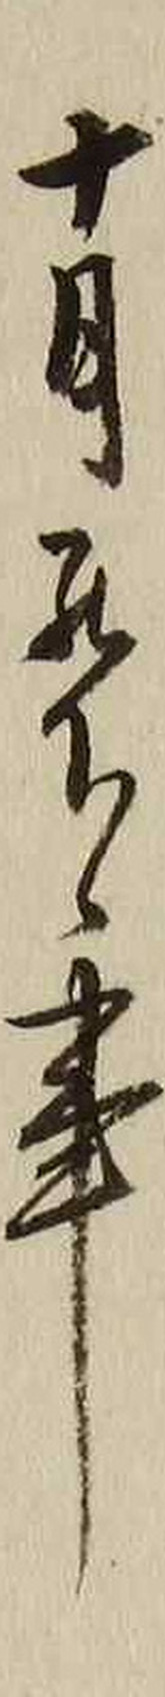十月罷下候事
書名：諸士系譜　巻之311　し之部1
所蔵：会津若松市立会津図書館
